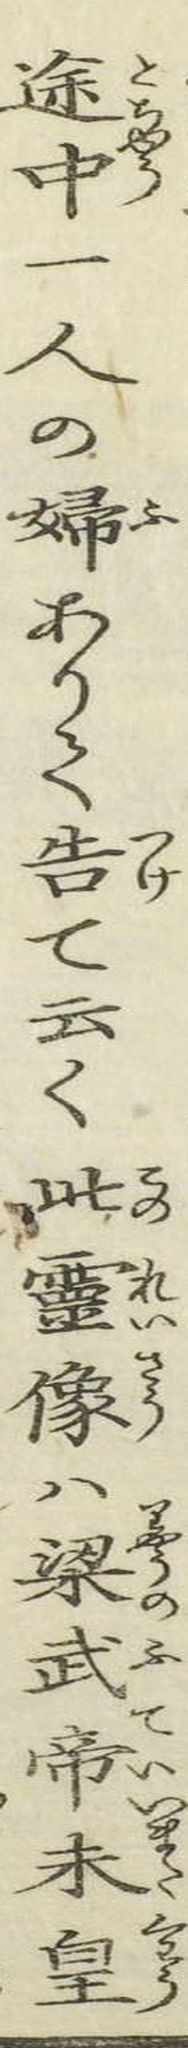途中一人の婦ありて告て云く此霊像は梁武帝未皇
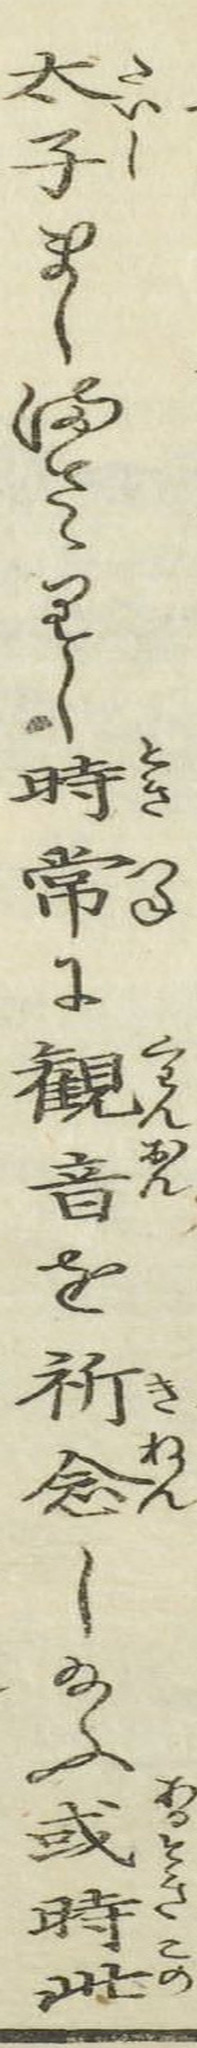太子ましまさゝりし時常に観音を祈念し給ふ或時此
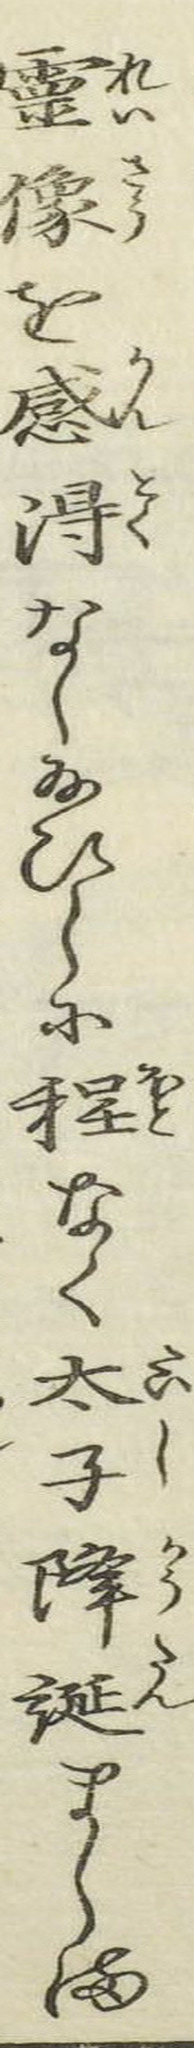霊像を感得なし給ひしに程なく太子降誕ましま
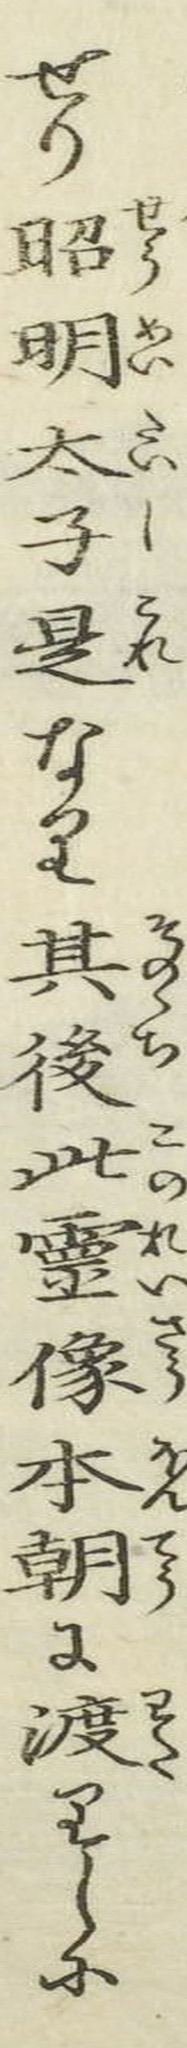せり昭明太子是なり其後此霊像本朝に渡りしに
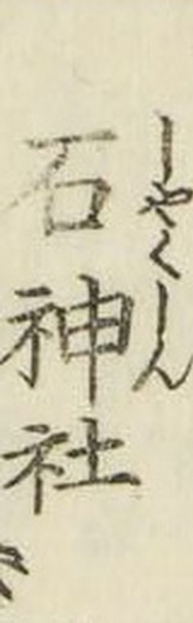石神社
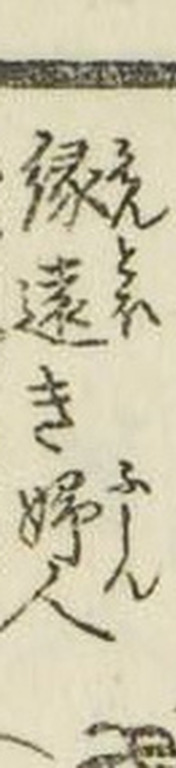縁遠き婦人
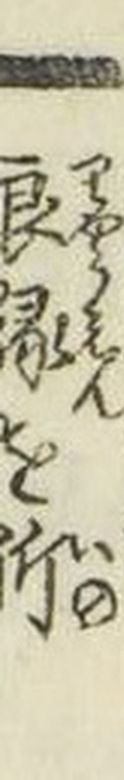良縁を祈
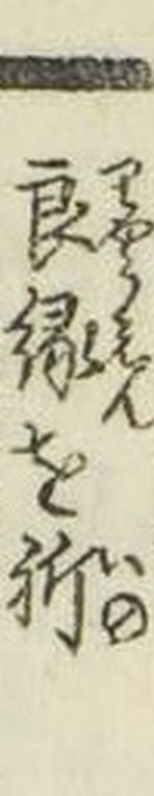良縁を祈
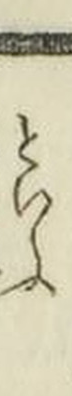といふ
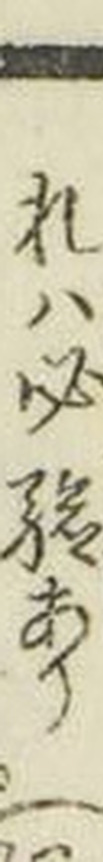れは必験あり
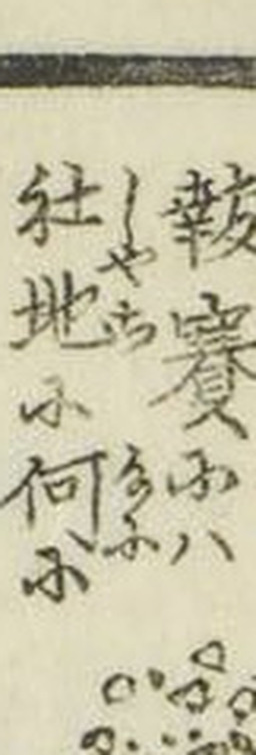社地に何に
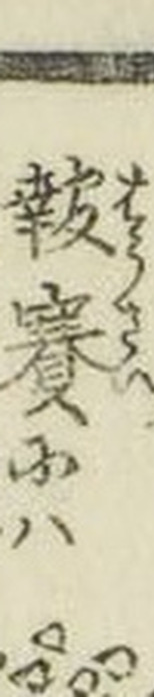報賽には
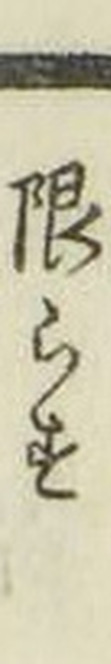限らす
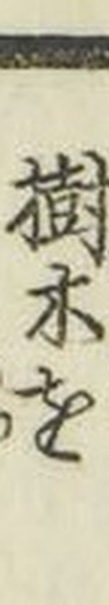樹木を
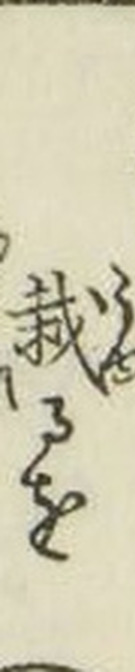栽るを
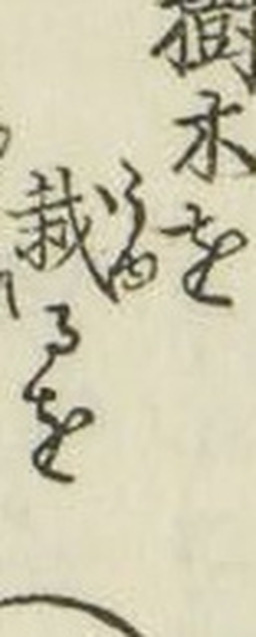栽るを
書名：江戸名所図会 20巻 巻之3
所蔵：東京学芸大学教育コンテンツアーカイブ
